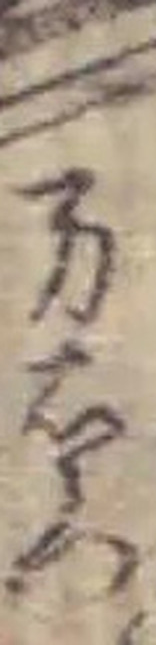万右衛門
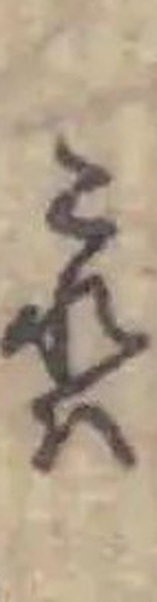これは
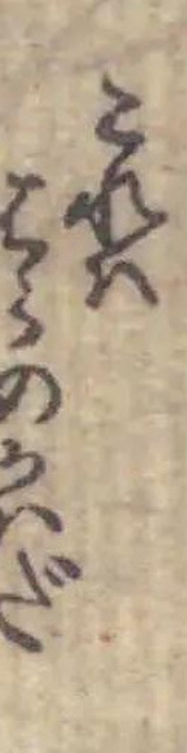これは
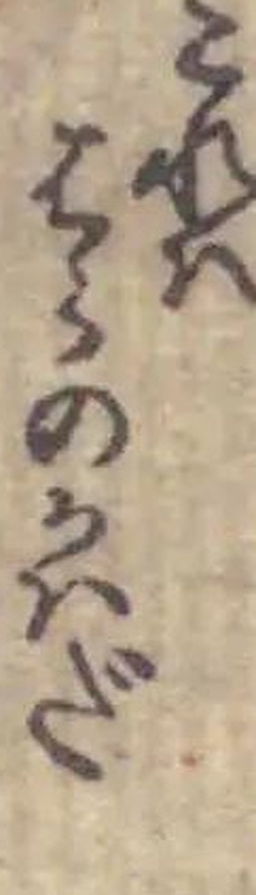はらのかはだ

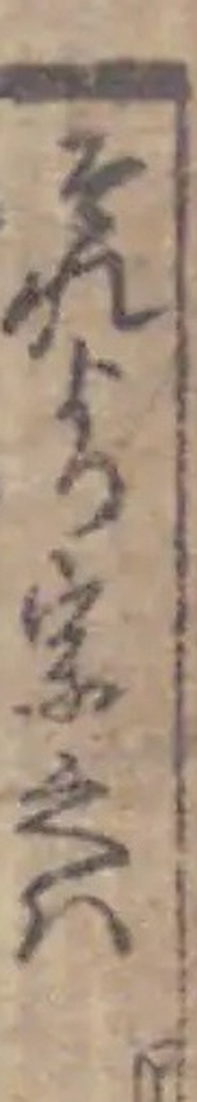それより宗之は
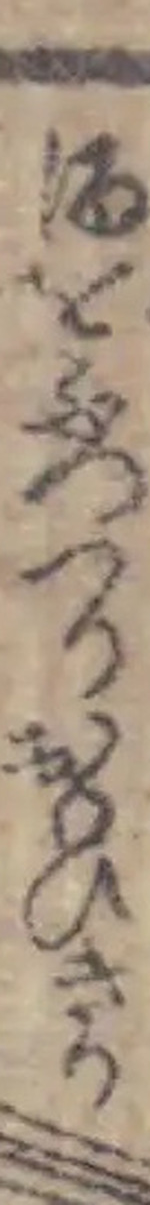酒をふつつりおもひきり
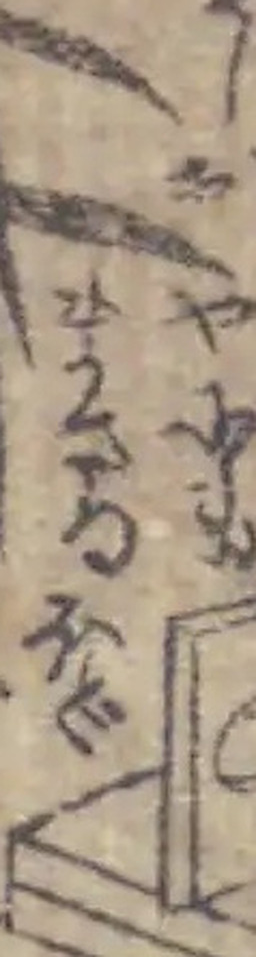まさるほど
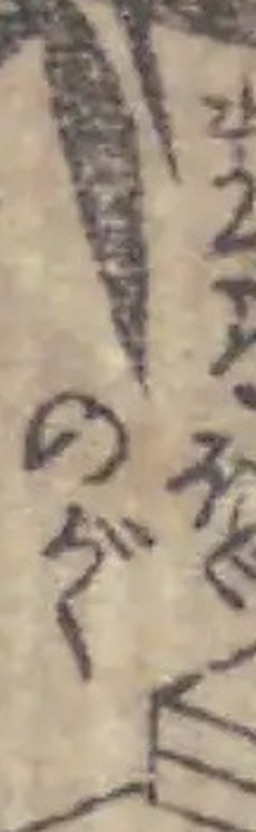のがく
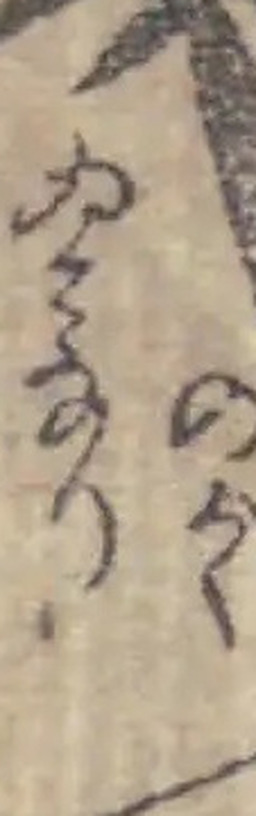ゐとなり
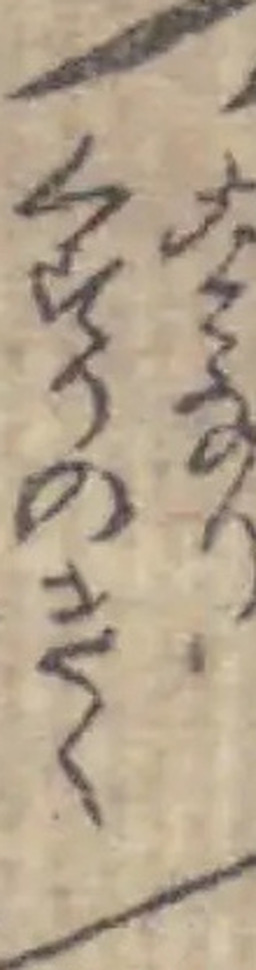くすりのきく
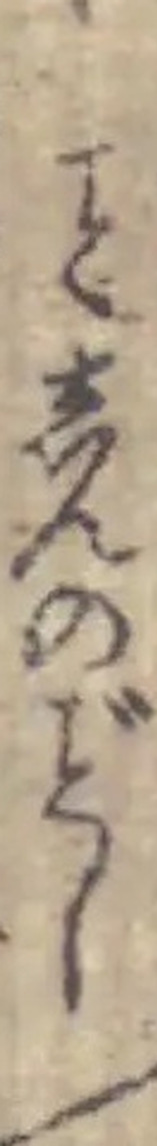ことしんのごとし
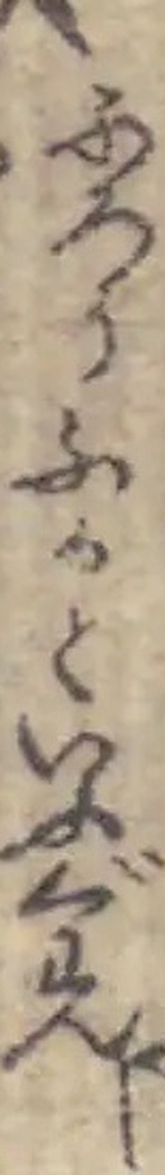ふろうふかといふぐわん
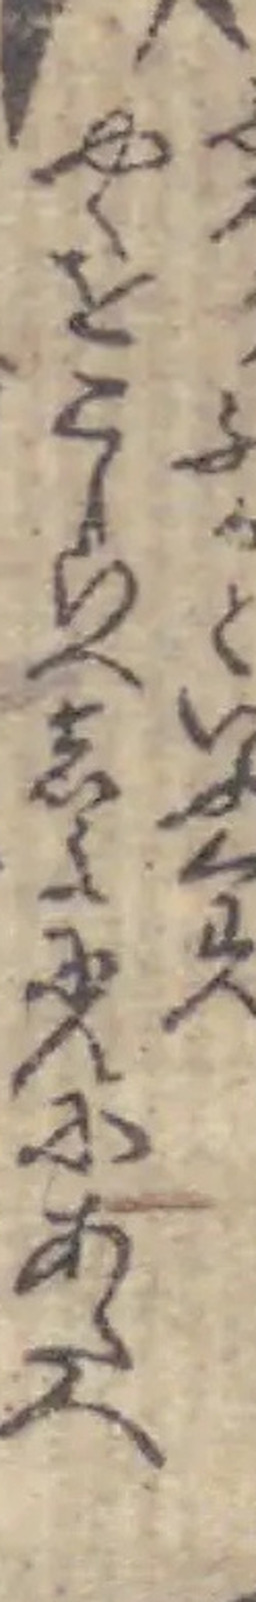やくをこしらへしよにんにあたへ
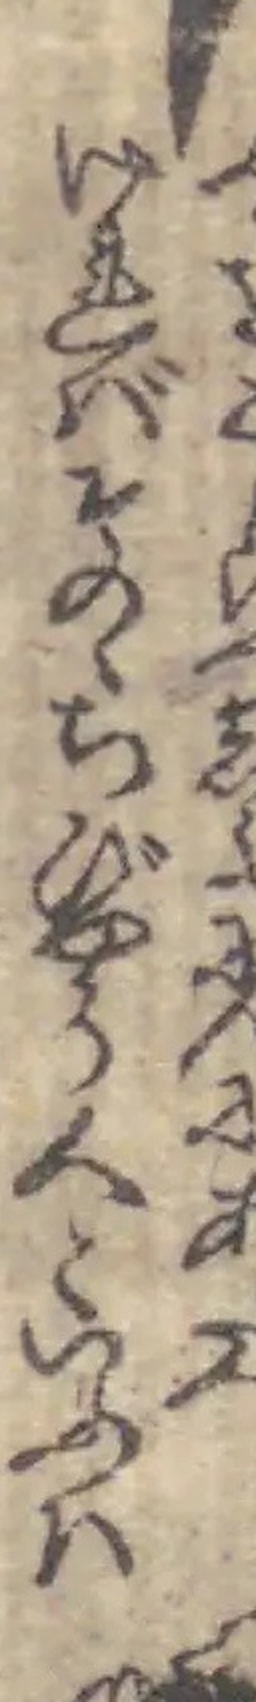ければそのゝちびやう人といふは
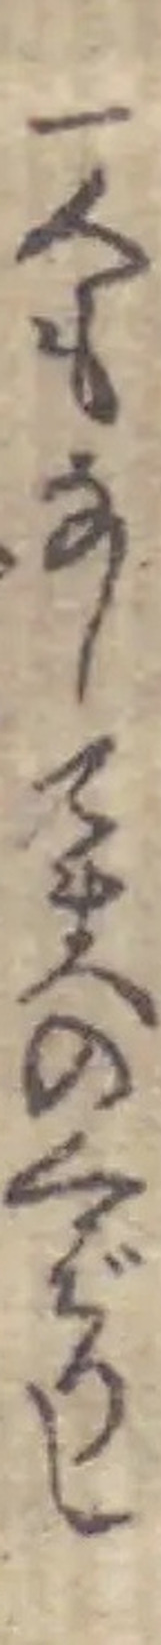一人もなしてまへのくばりし
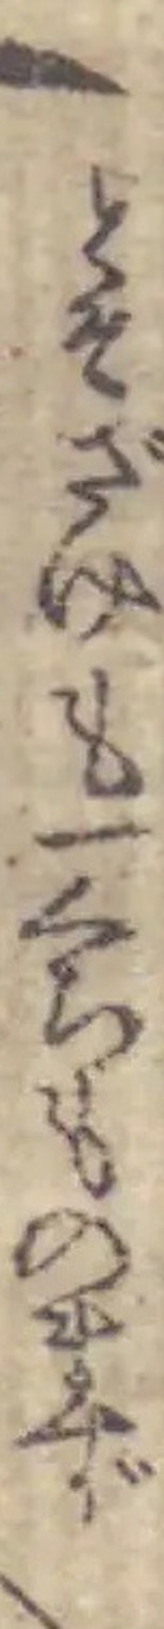とそざけも一くちものまず
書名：飲中八人前 3巻
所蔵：国立国会図書館 National Diet Library, JAPAN
